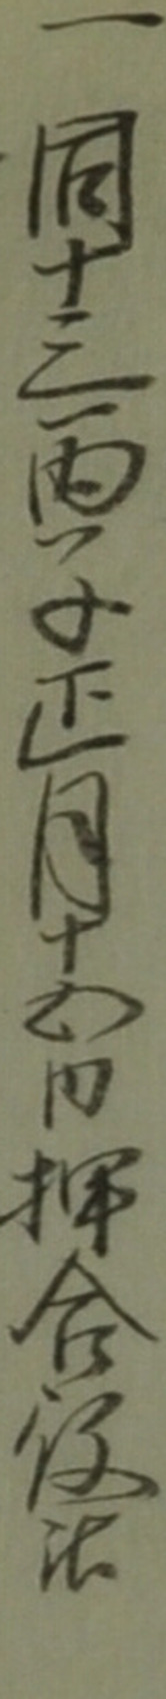一同十三丙子正月十五日押合役被
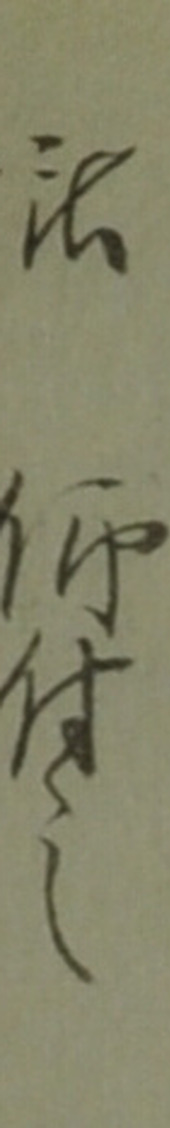被仰付之
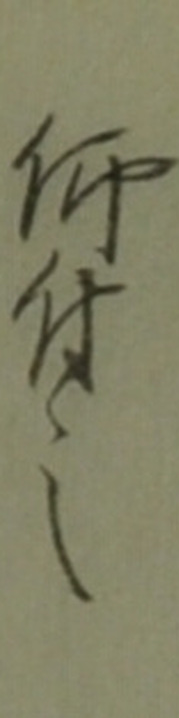仰付之
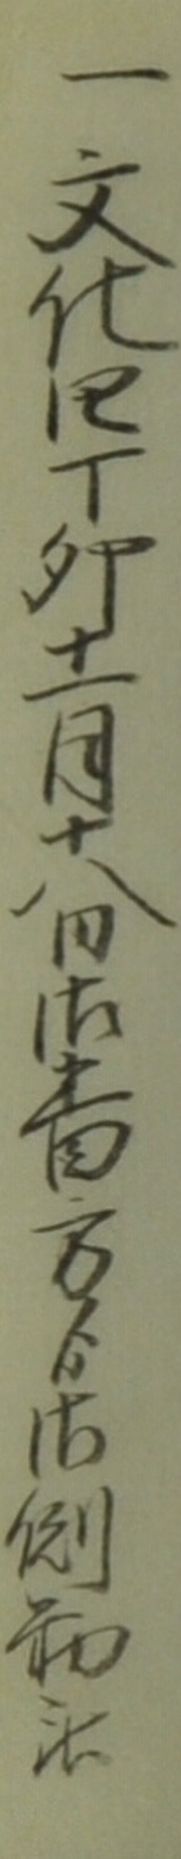一文化四丁卯十い一月十八日御番方ゟ御側勤被
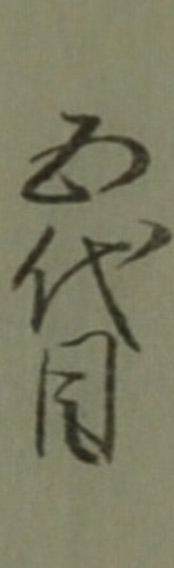五代目
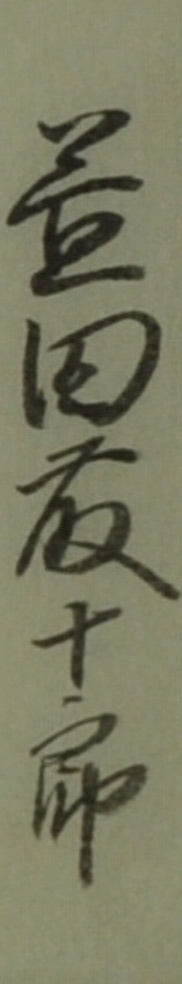益田藤十郎

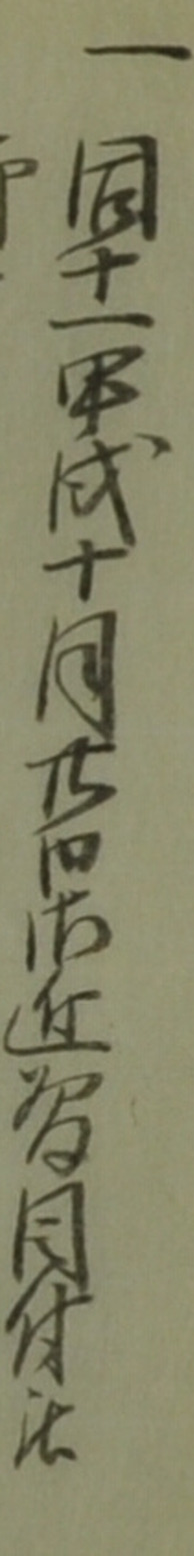一同十一甲戌十月廿日御近習目付被
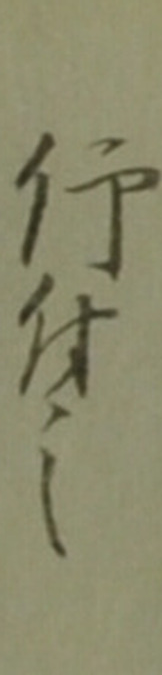仰付之
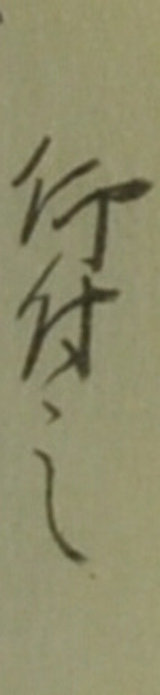仰付之
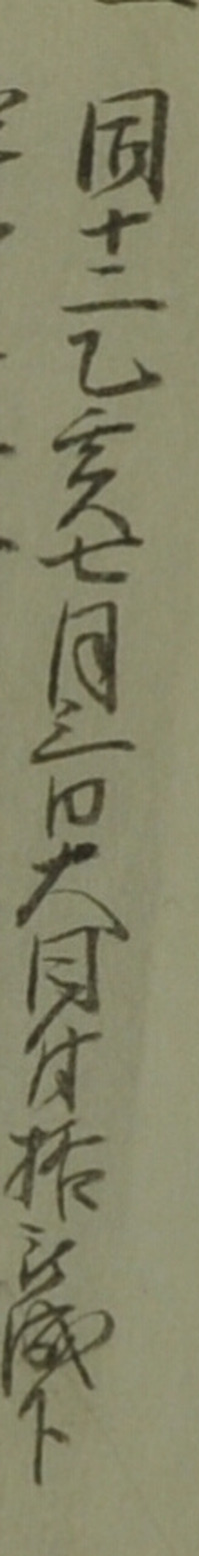一同十二乙亥七月三日大目付格被成下
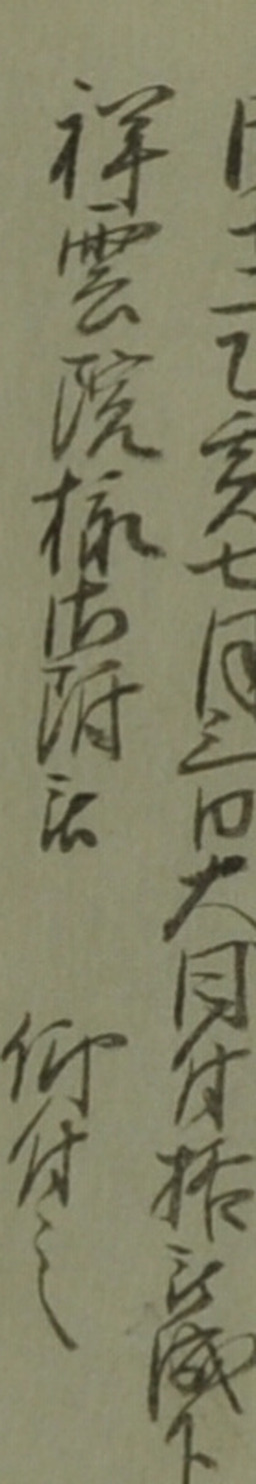祥雲院様御附被仰付之
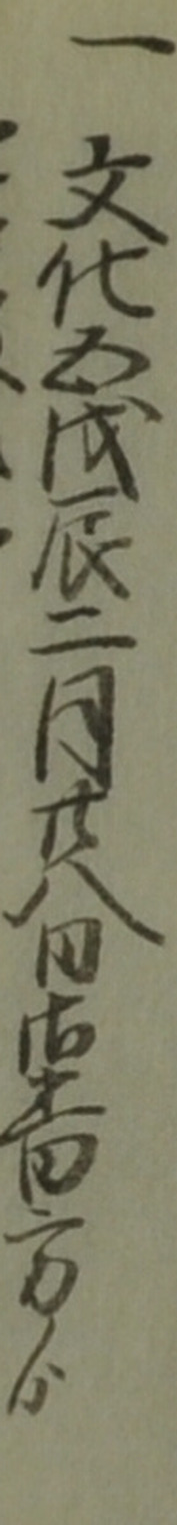一文化五戊辰二月廿八日御番方ゟ
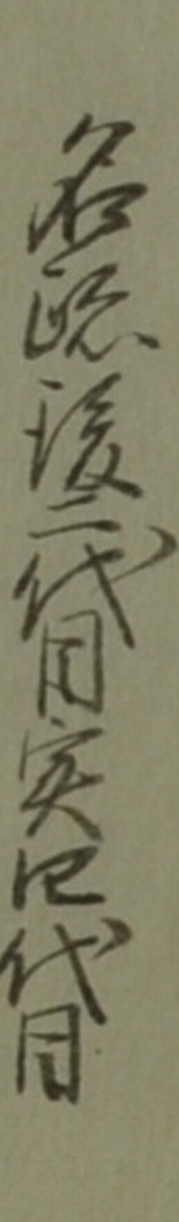名跡後二代目実四代目
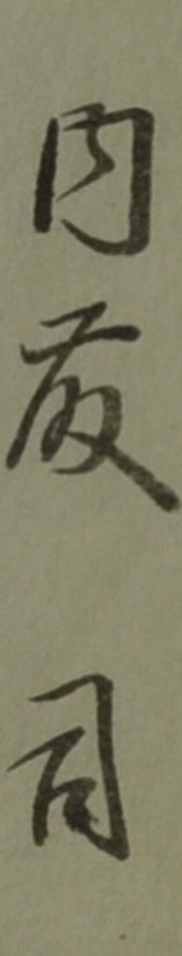内藤司
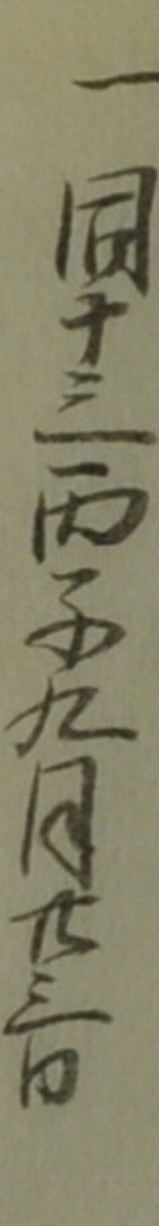一同十三丙子九月廿三日
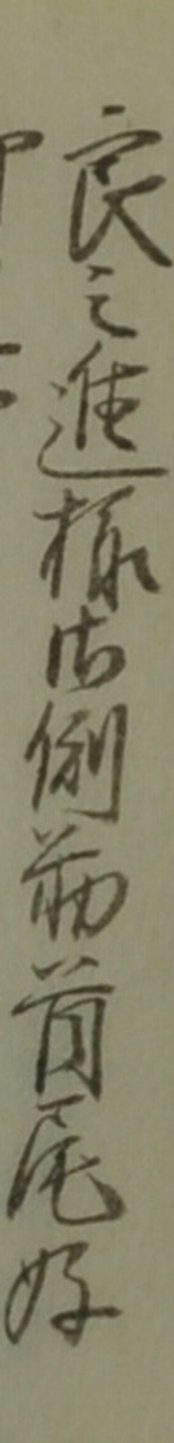良之進様御側勤首尾好
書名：諸御役代々録（五）
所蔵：伊那市立高遠町図書館・合同会社AMANE
